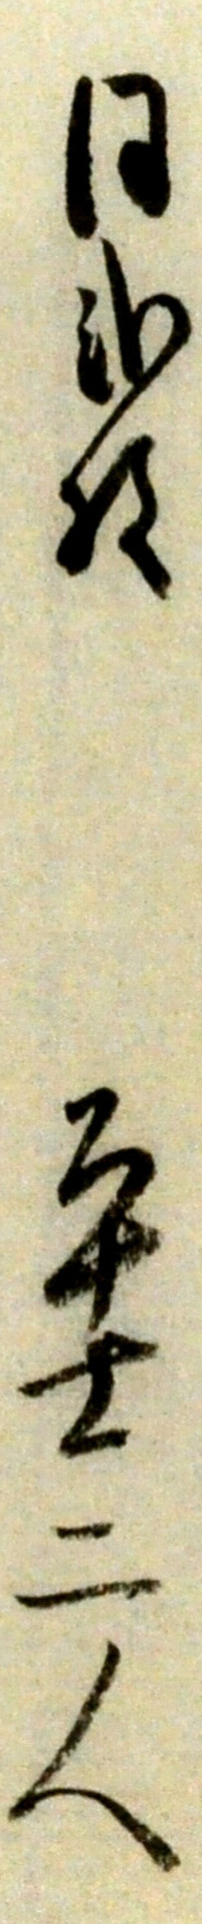同弐枚平士二人
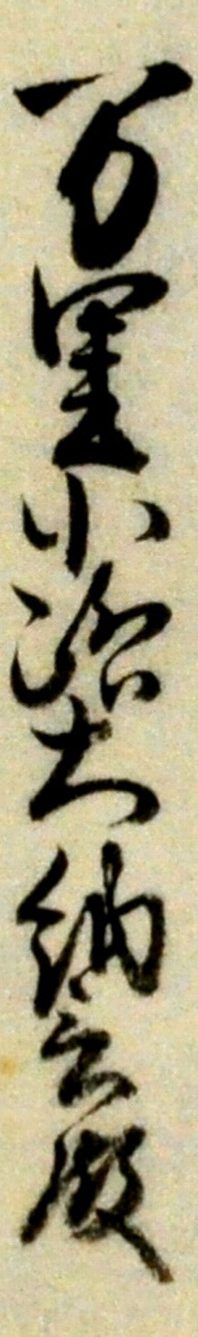万里小路大納言殿
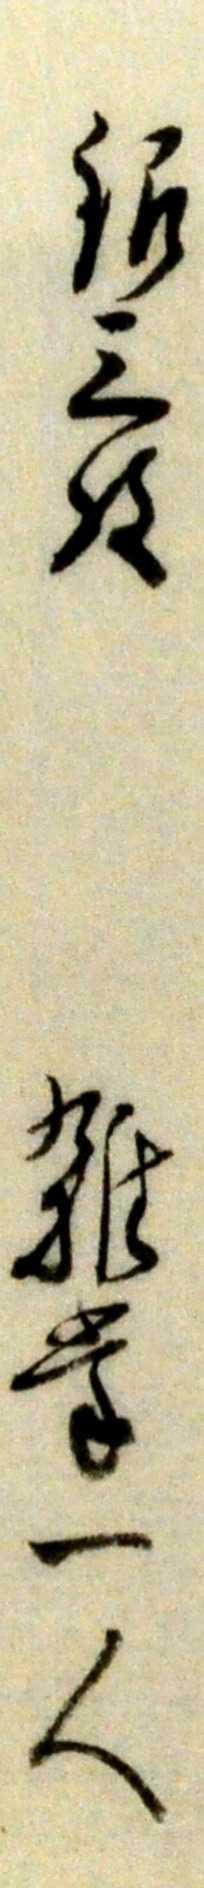銀三枚雑掌一人
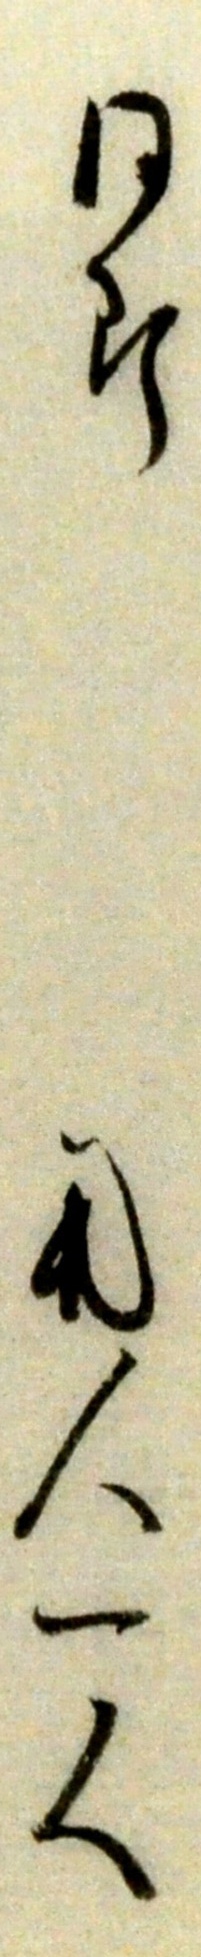同断用人一人
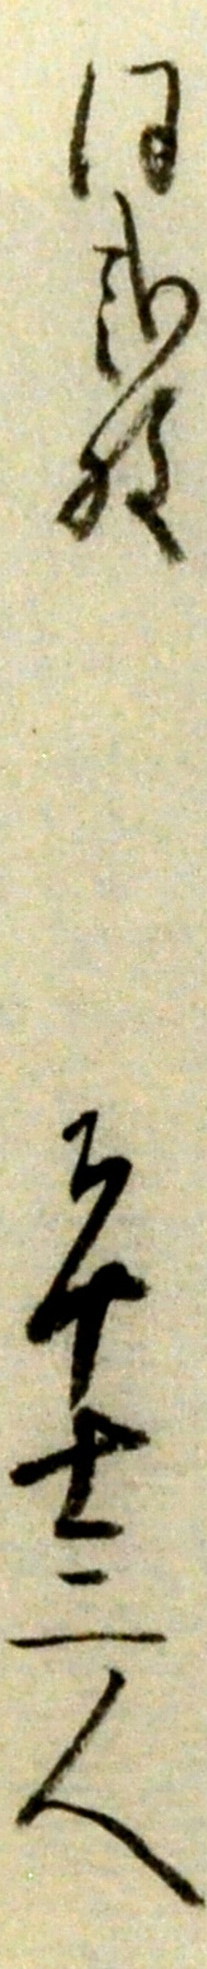同弐枚平士二人

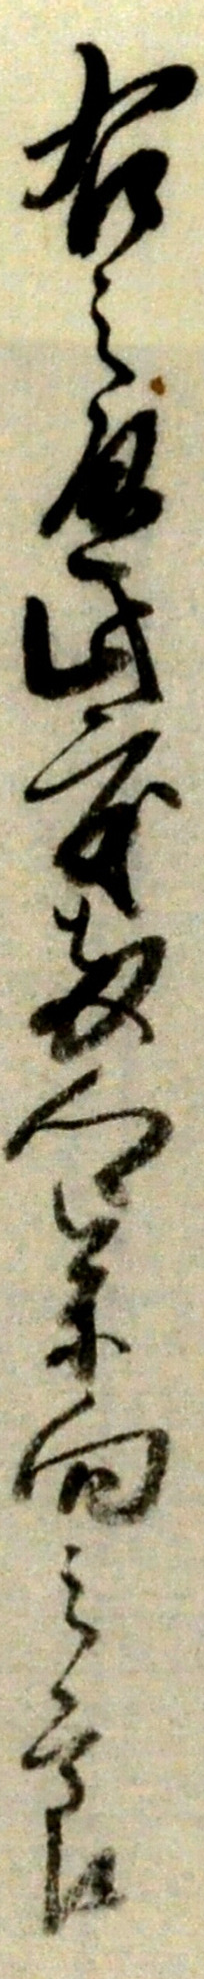右之通此度両卿参向の節
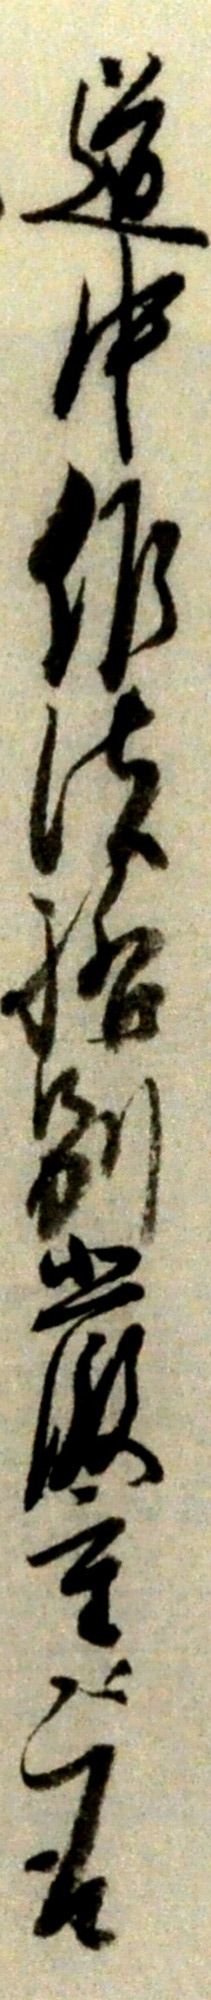道中作法格別厳重に取
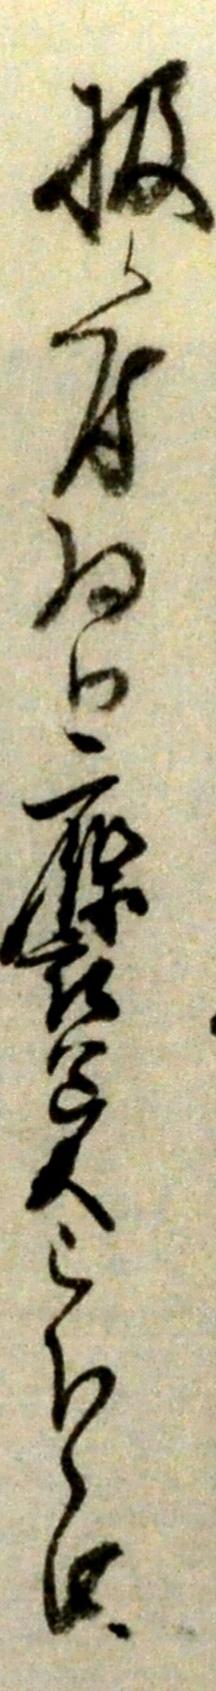扱候付為御褒美被下候由
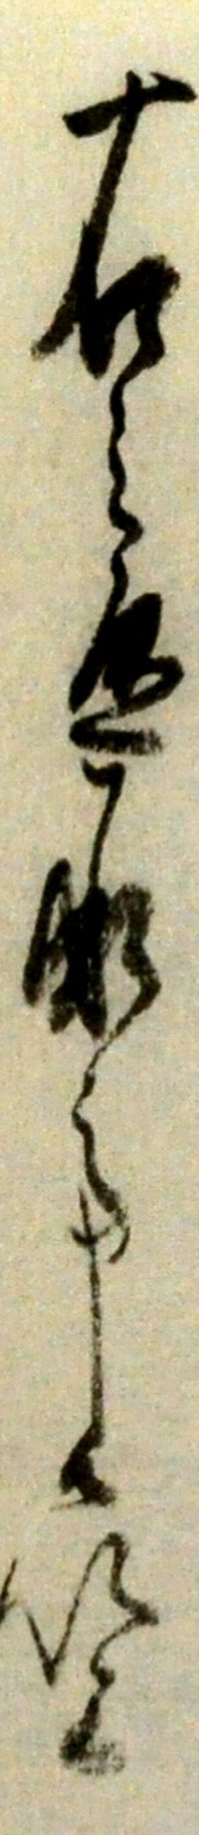右之通承之申候以上
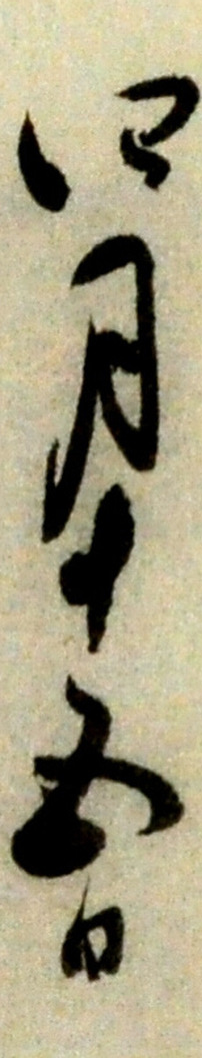四月十五日
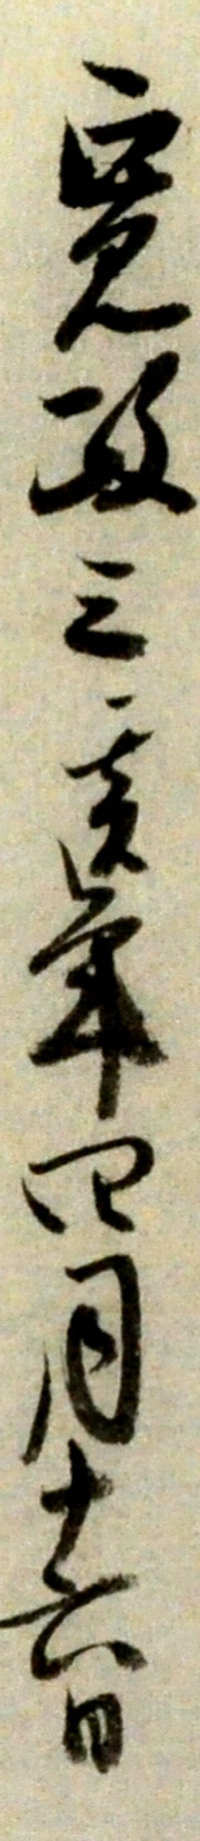寛政三亥年四月十六日
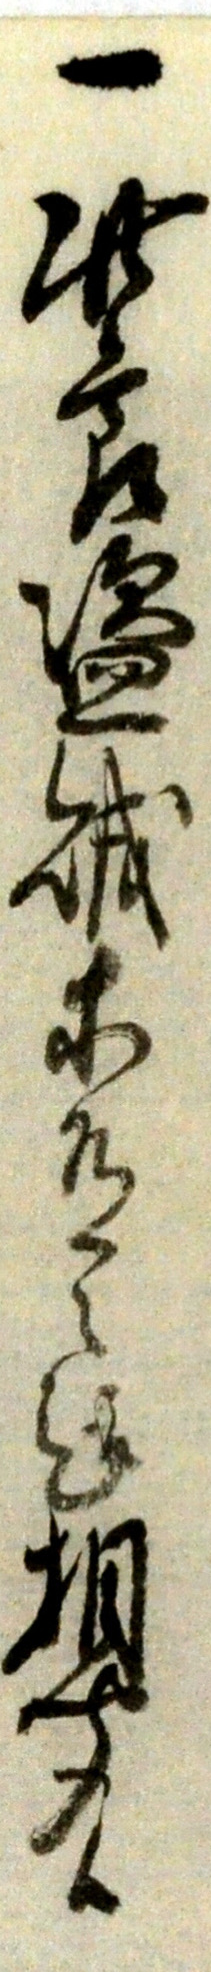一此節盗賊等有之趣相聞候
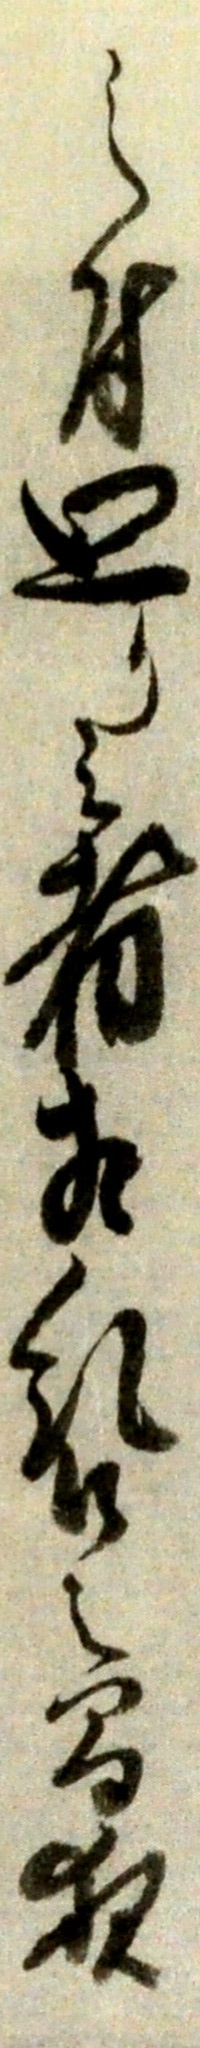之付廻之者相糺候之間夜
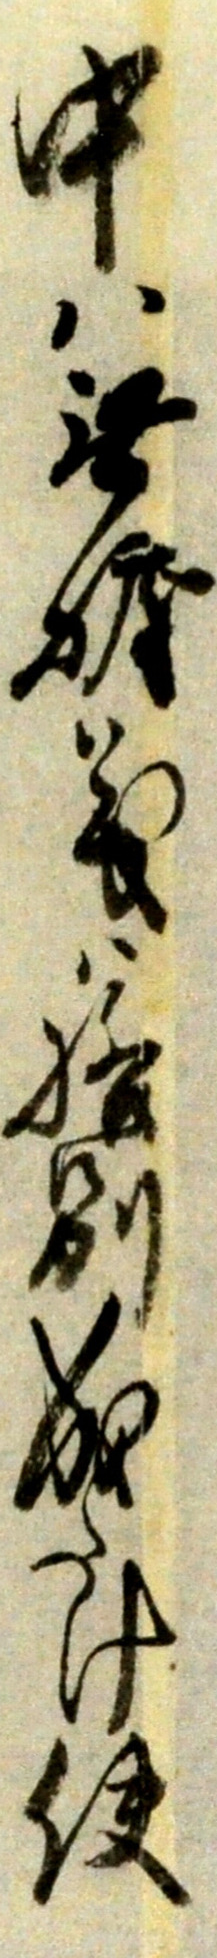中は無拠義は格別成たけ使
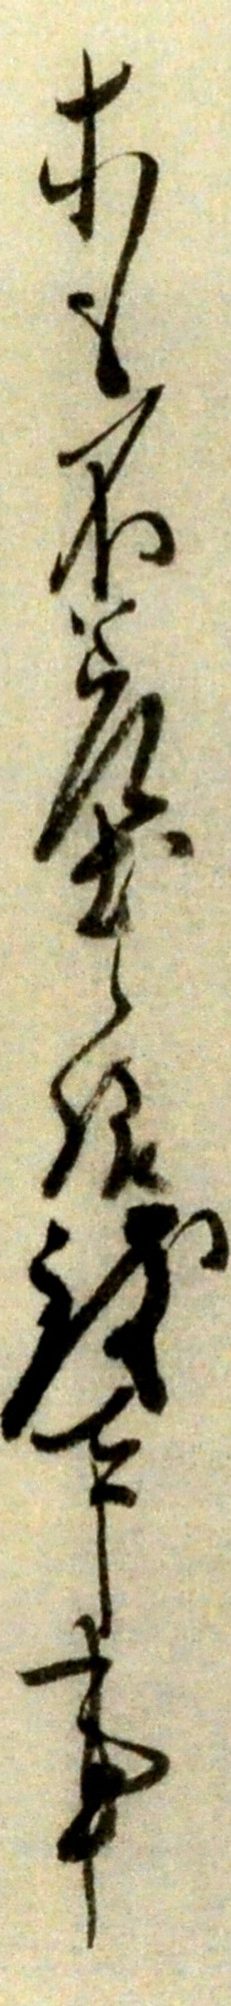等も不差出候様致可申事
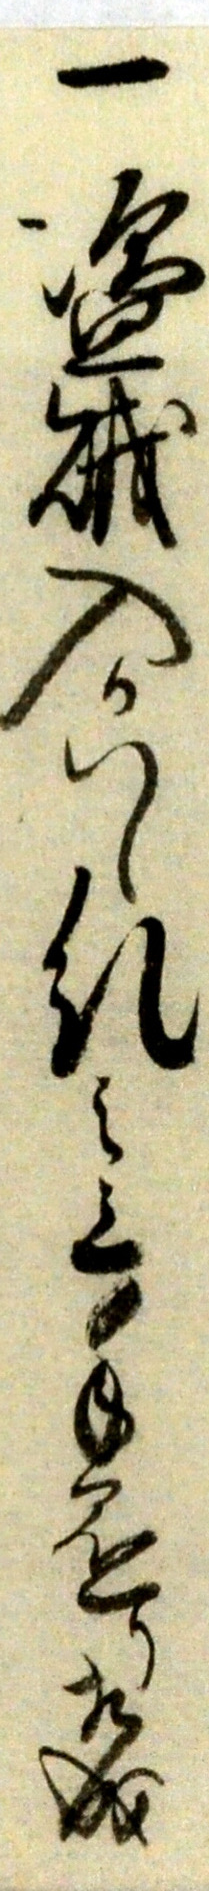一盗賊入候はゝ糺之上手懸相成
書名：申合帳〔一括〕
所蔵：伊那市立高遠町図書館・合同会社AMANE
